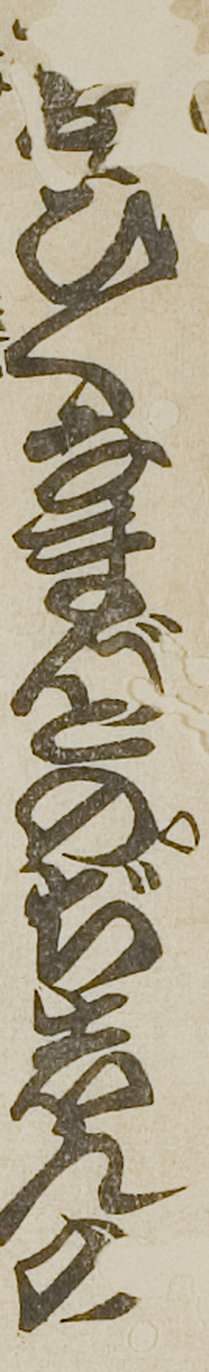〽おひ〳〵なまづどの。ぢしんの
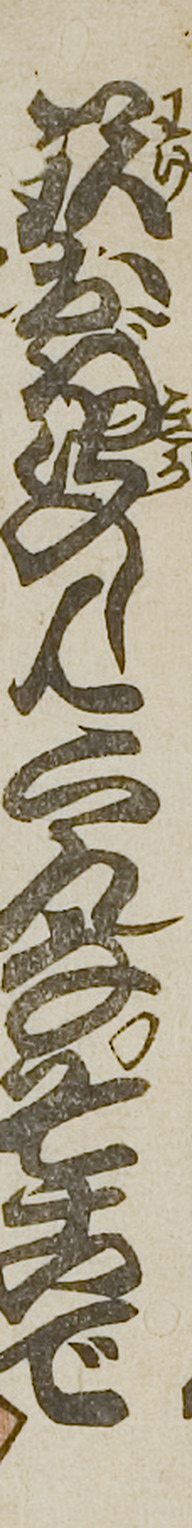訳おば聞してくんな。そこで
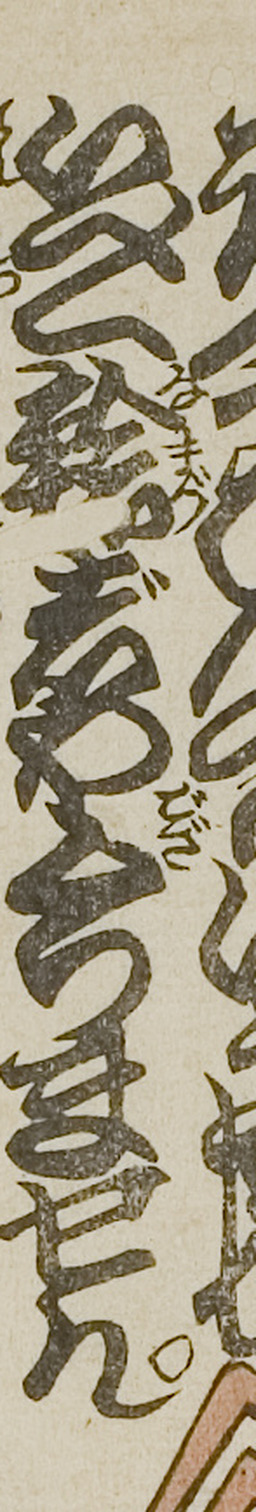いへ〳〵鯰じや厶りません。
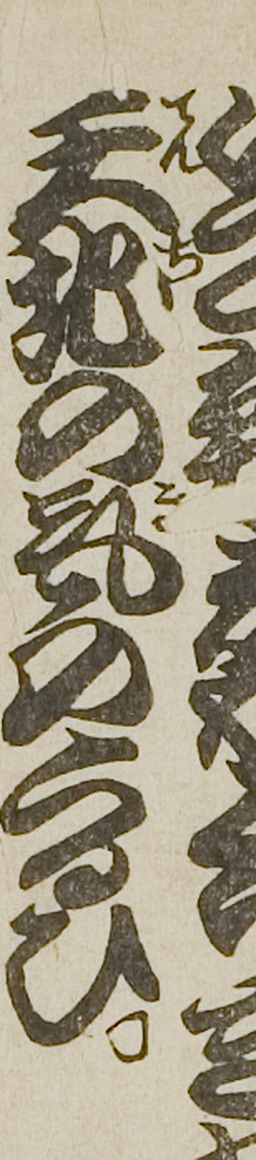天地の気のくるひ。
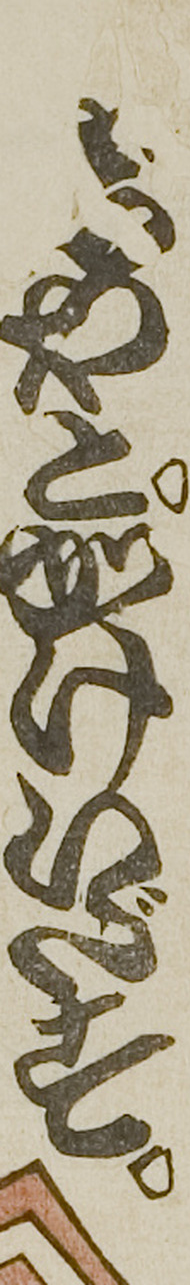じやと。かけいだす。
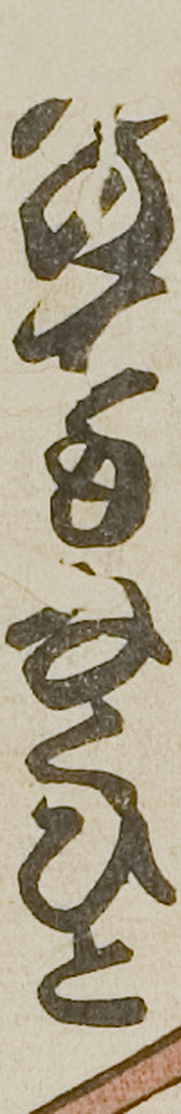のてもなくひと
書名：大津画ぶし
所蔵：東京大学総合図書館 General Library in the University of Tokyo, JAPAN
